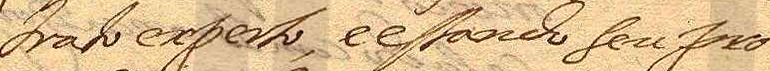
trato experto, e estando seu pro
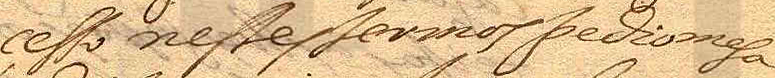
çesso nestes termos pedio mesa
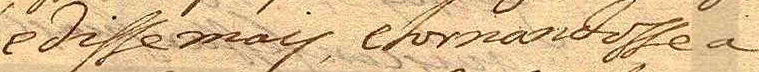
e disse mais, e tornandosse a
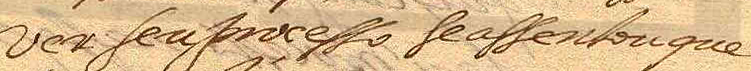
ver seu proçesso se assentou que
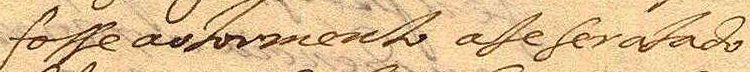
fosse ao tormento ate ser atado
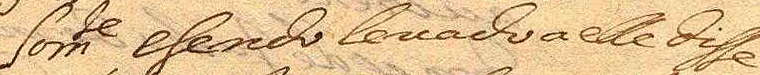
somte, e sendo levado a elle disse
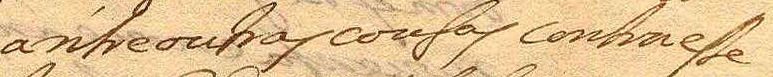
antre outras cousas contra este
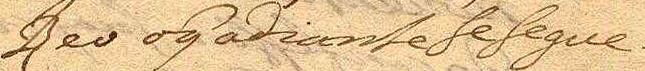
Reo o q̄ adiante se segue.
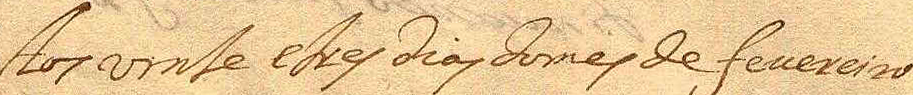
Aos vinte e tres dias do mes de feuereiro
